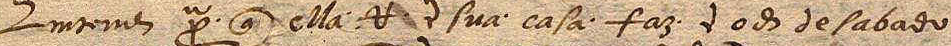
Emtemdi ꝓ̄. q̄ ella. R. ē sua. casa. faz. ē o di de sabado
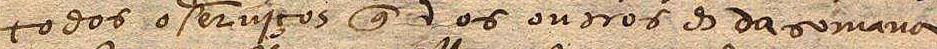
todos o serujços q̄ ē os outros di da somana
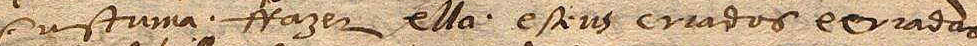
Custuma . ffazer ella . e seus criados e criadas
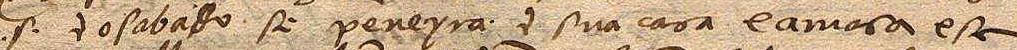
.s. ē o sabado se peneyra. ē sua casa e amasa e se
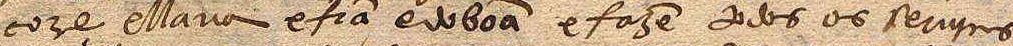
coze e llaua e fiā e doboā e fazē todos os serujcos
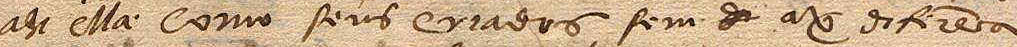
asi ella. como seus criados sem _ aꝟ difer̄eca
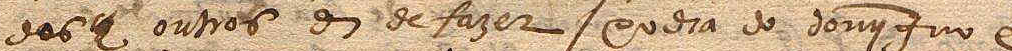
dos_ outros di de fazer / e o dia do dom̄jguo e
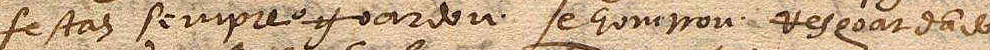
festas sempre o goardou. e homrrou . Resgoardādo
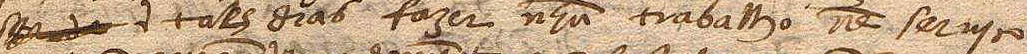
s__ ē taes dias fazer n̄hu trabalho n̄e serujco
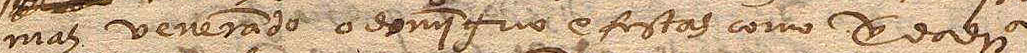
mas vener̄ado o dom̄jguo e festas como ꝟdadrra
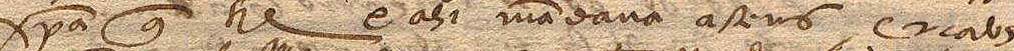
Xpā q̄ he e asi m̄adaua a seus criados
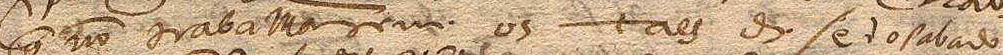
q̄ n̄o trabalhasem. os taes di / e ē o sabado
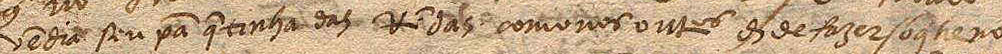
vēdia seu p̄a q̄ tinha das Rēdas. como nos outos di de fazer / o q̄ he no
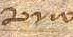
torio
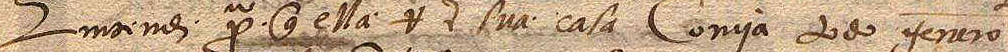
Emtendi ꝓ̄ q̄ ella. R ē sua. casa Comja todo genero
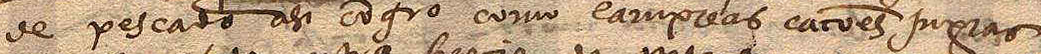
de pescado asi c̄ogro como lampreas cacões Jngias
